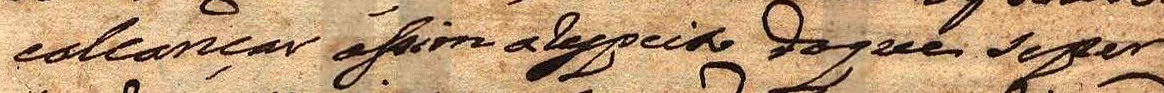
e alcançar assim a Respeito do que se per
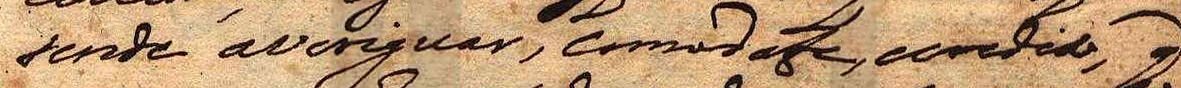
tende averiguar, como da fe, e credito q̄
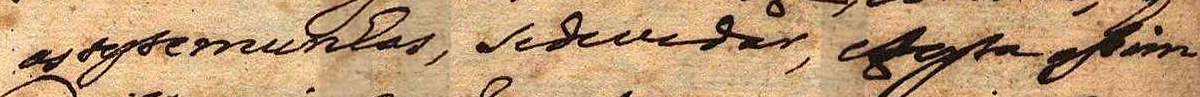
as testemunhas, se deve dar, e feyta assim
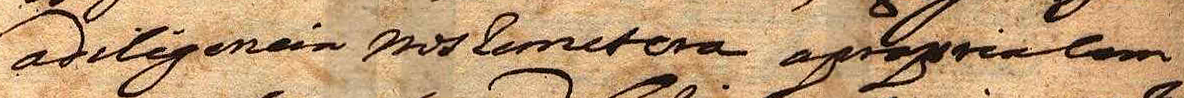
a diligencia nos Remetera a propria com
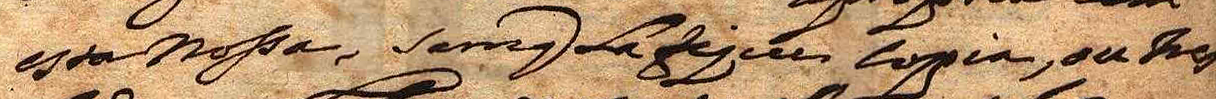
esta nossa, sem q̄ La fique copia, ou tres
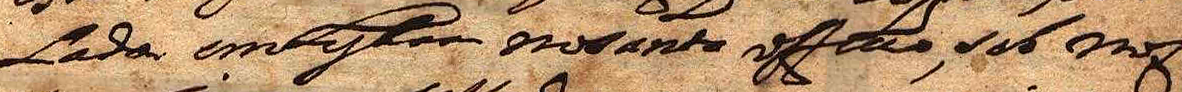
Lado em Lisboa no santo officio, sob nos
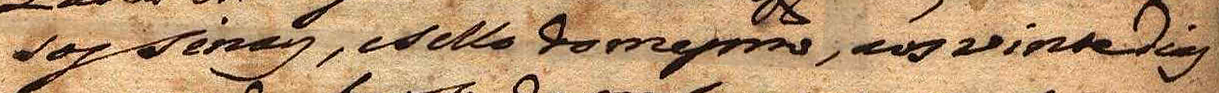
sos sinais, e sello do mesmo, aos vinte dias
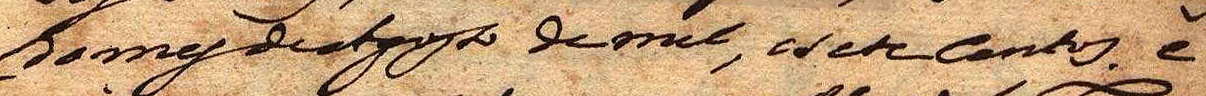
do mes de Agosto de mil, e setecentos. e
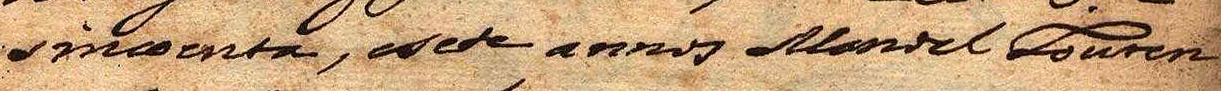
sincoenta, e sete annos Manoel Louren
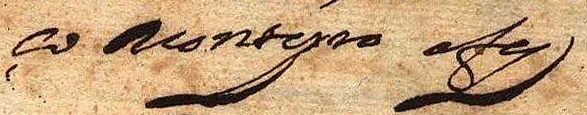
ço Monteyro o fes
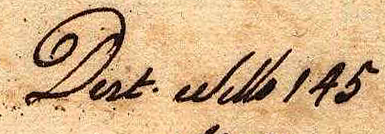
Dest. e sello 145
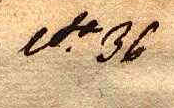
ct.a 36
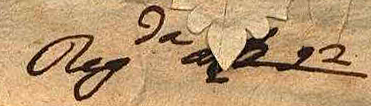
Regda a fL 12
